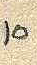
10
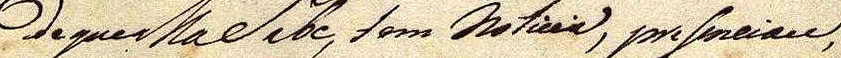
de que ella sabe, tem noticia, presenciou,
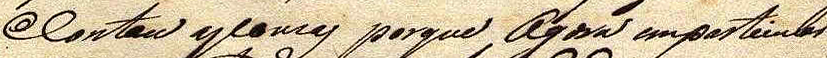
e contou as couzas porque agora em particular
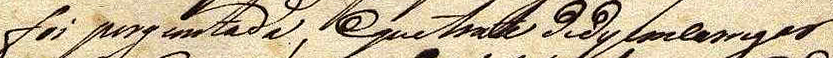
foi perguntada, e que trata de desemcarregar
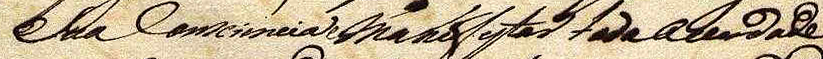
sua consciencia e manefestar toda a verdade
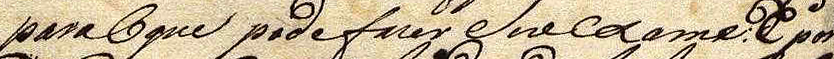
para O que pode fazer seu exame: E por
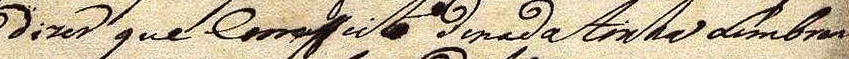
dizer que Com effeito de nada tinha Lembran
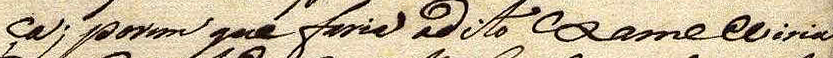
ça; porem que faria o dito exame e viria
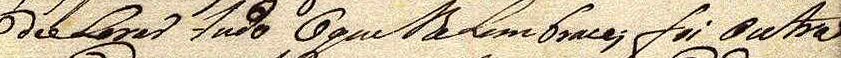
decLarar tudo O que lhe Lembrace; foi outra
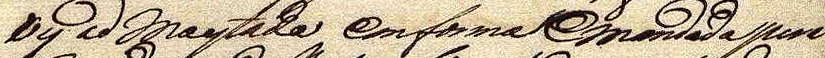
ves admoestada conforme e mandada para
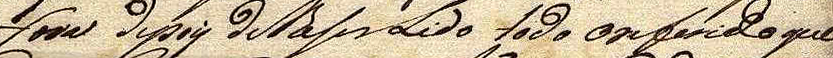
fora depois delhe ser Lido todo o referido que
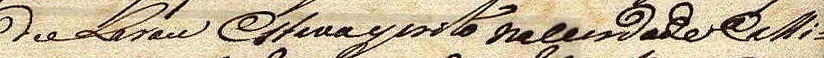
decLarou estava escrito na verdade e assi
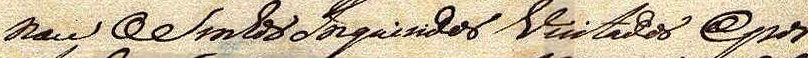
nou o Senhor Inquizidor Visitador e por
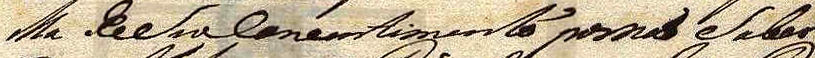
ella E seu concentimento por naõ saber
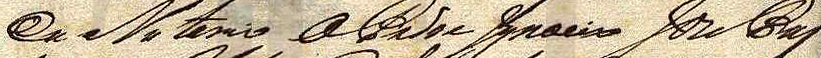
eu Notario O Padre Ignacio Joze Pas
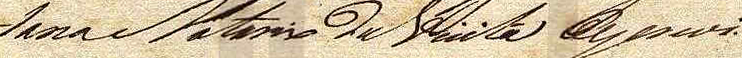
tana Notario da Visita O escrevi.
